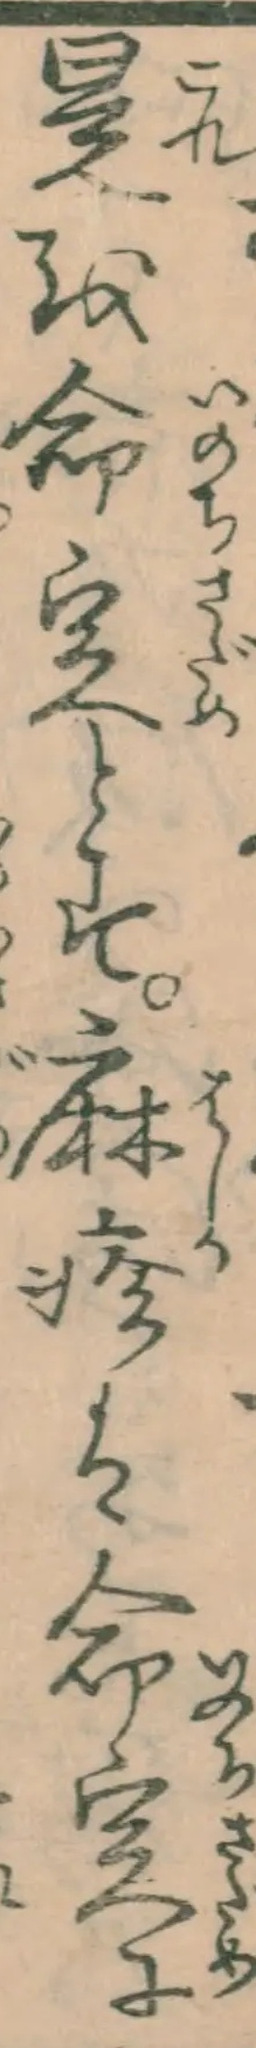是を命定とす。麻疹は命定に
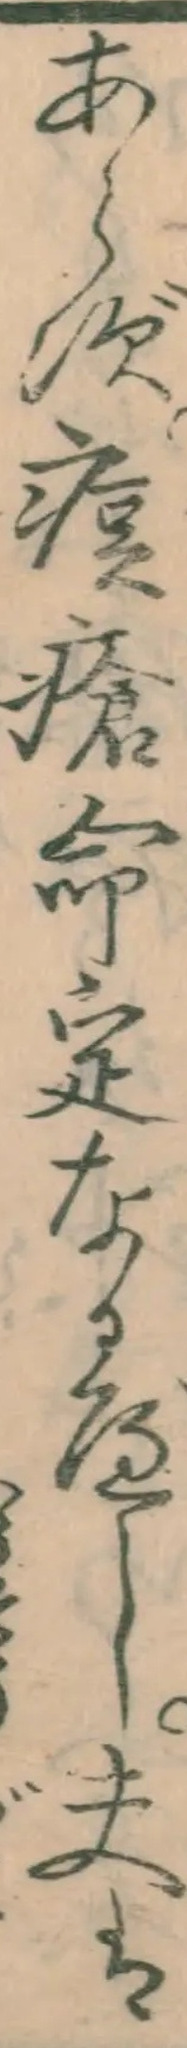あらず。疱瘡命定なるべし。夫は
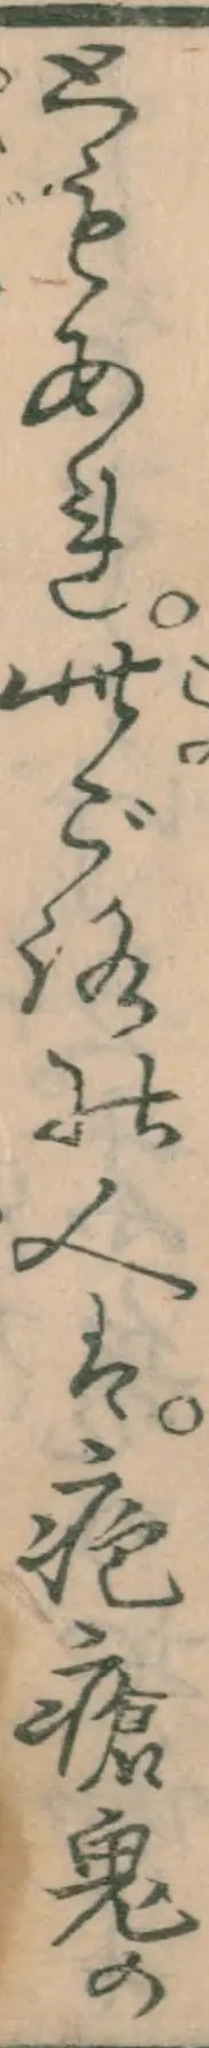ともあれ。此ごろの人は。疱瘡鬼か
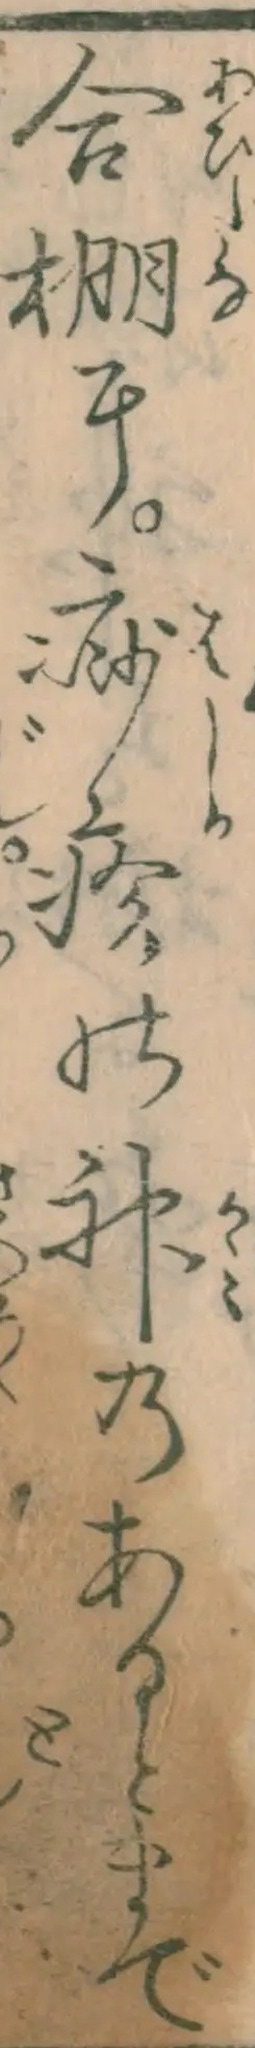合棚に。麻疹の神のあるとまで
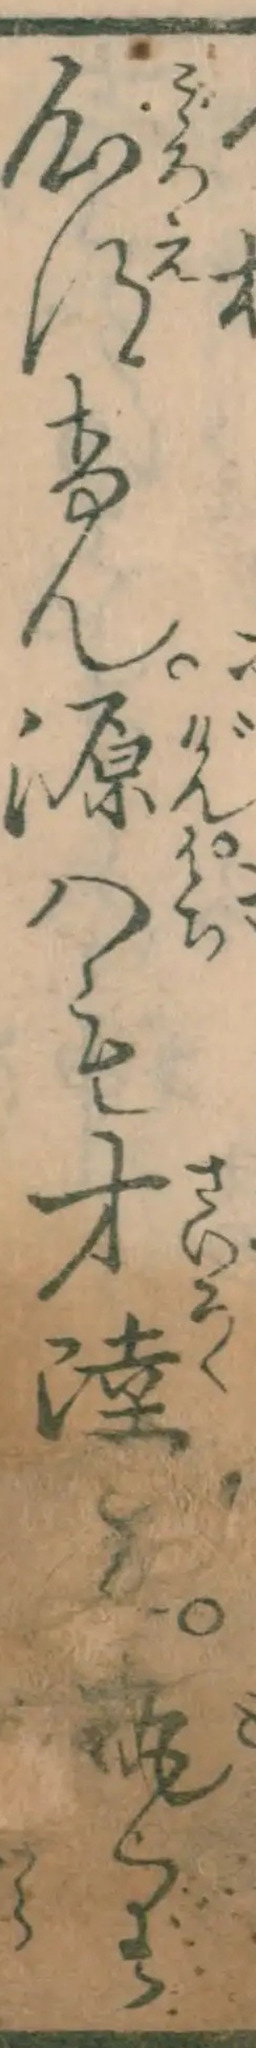心得けん。源八も才陸も。執り
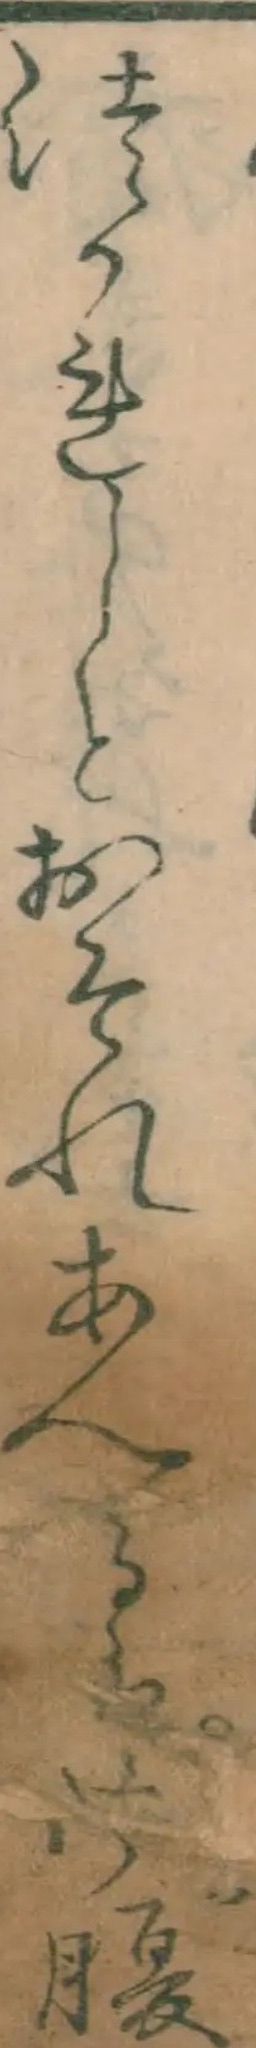つかれしとおそれあへるは。片腹

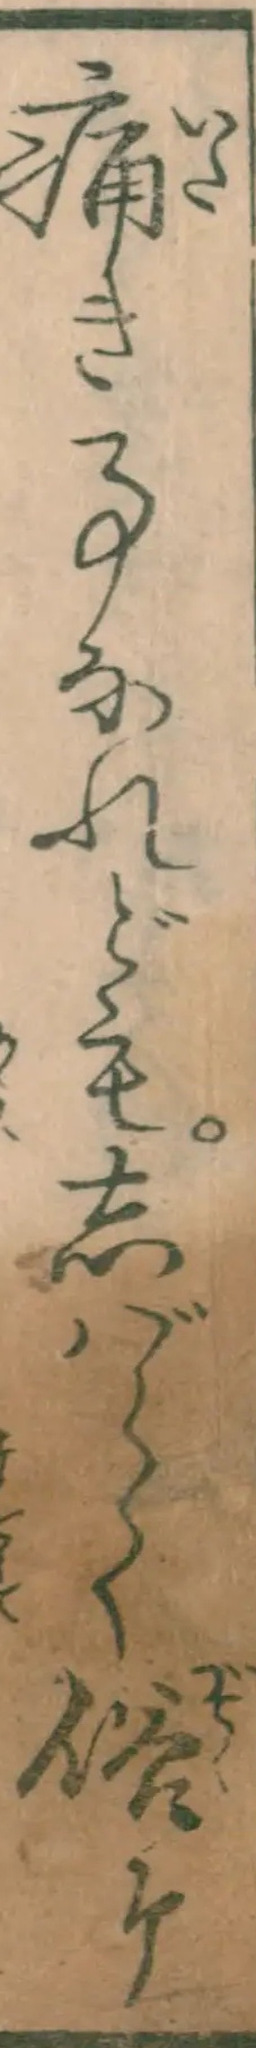痛き事なれども。しばらく俗に
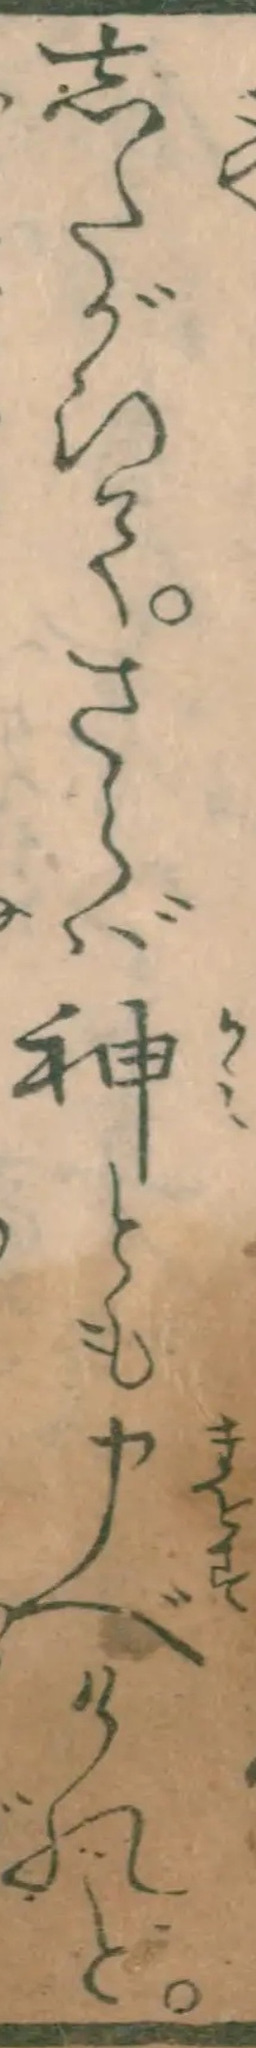したがひて。さらば神とも。申べけれど。
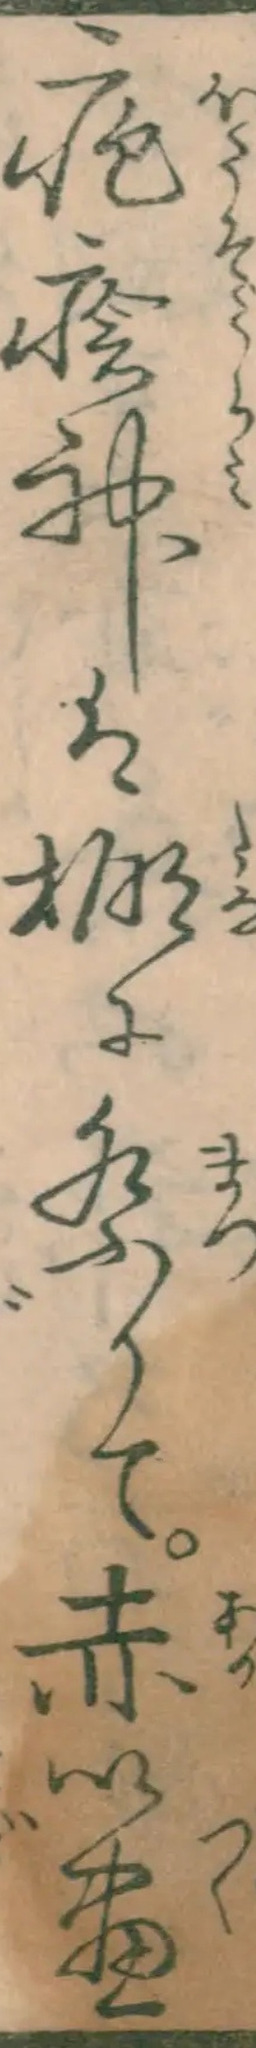疱瘡神は棚に祭りて。赤い尽
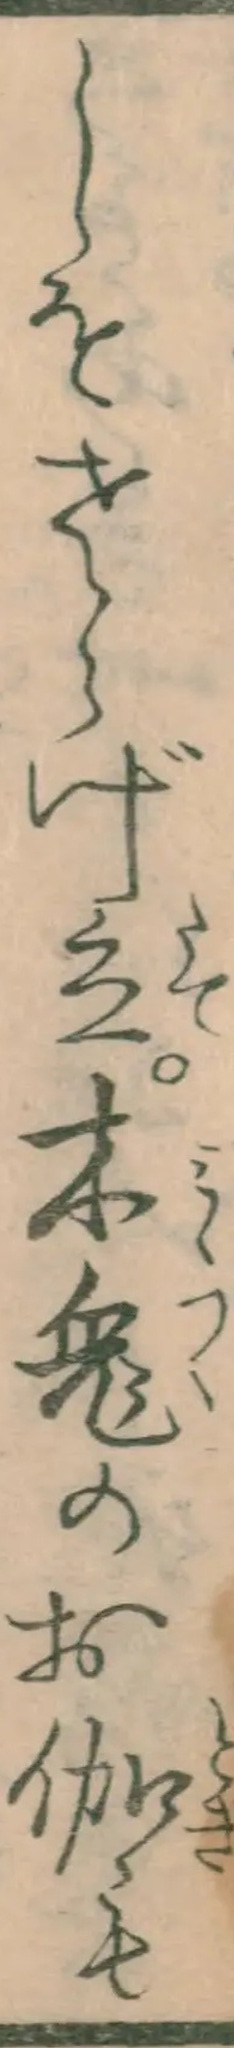しをさ〻げ立。木兎のお伽も
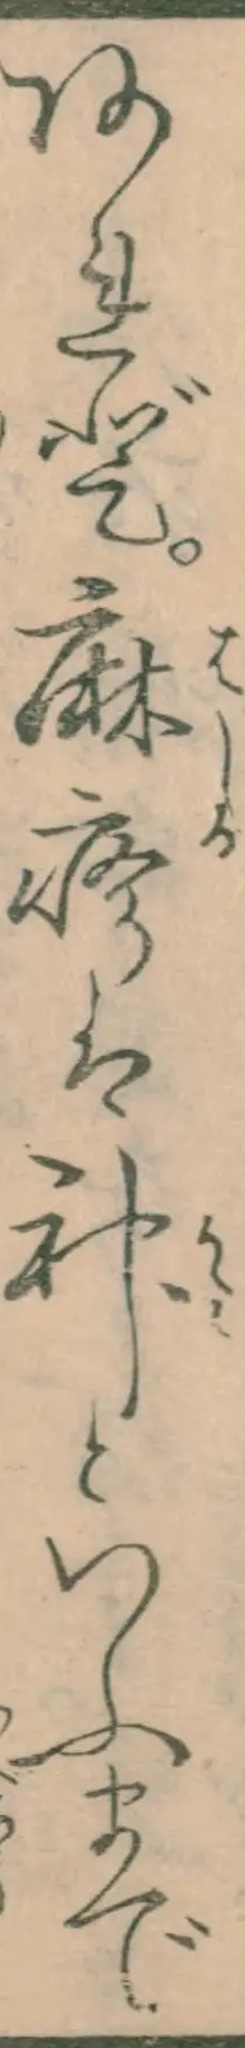あれど。麻疹は神といふまで
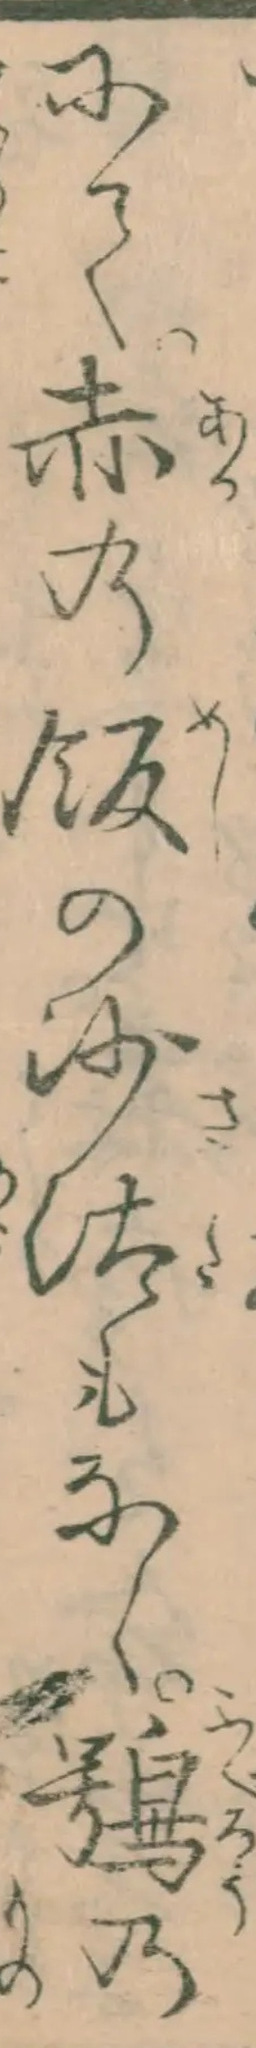にて。赤の飯の沙汰もなく。鴞の
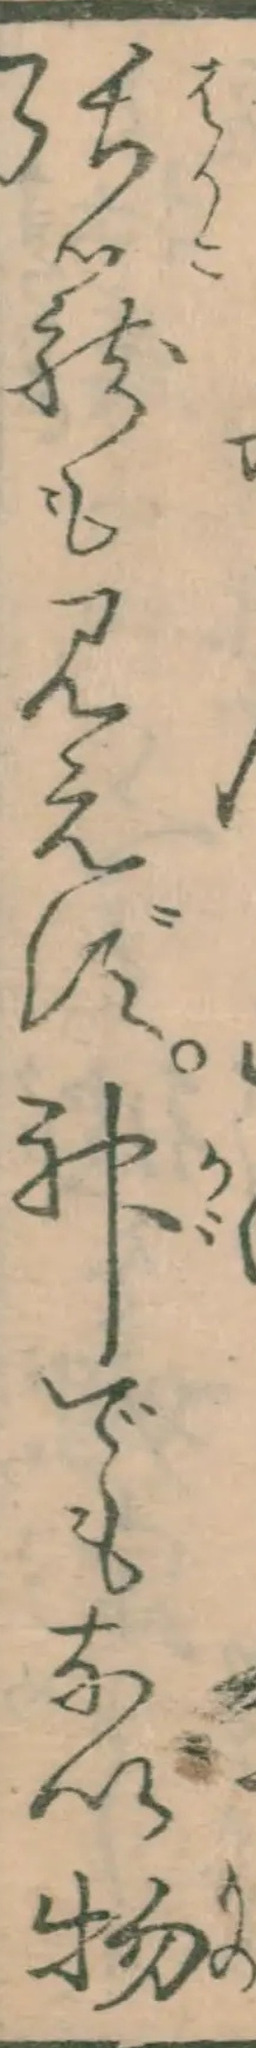張籠も見えず。神でもない物
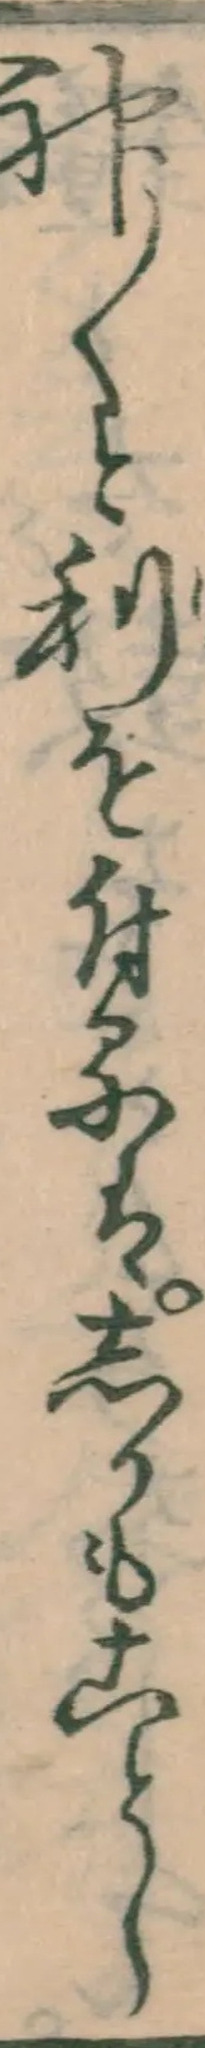神〳〵と利を付るは。しりもことし
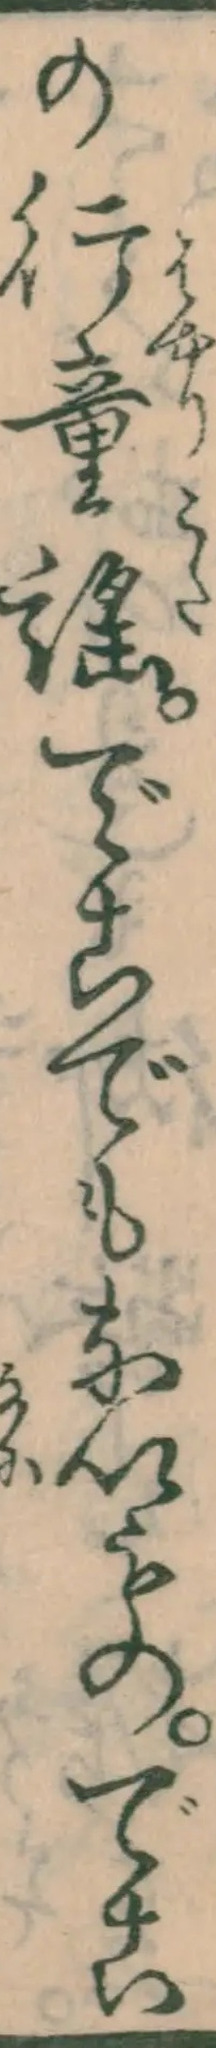の行童謡。でこでもないもの。でこ
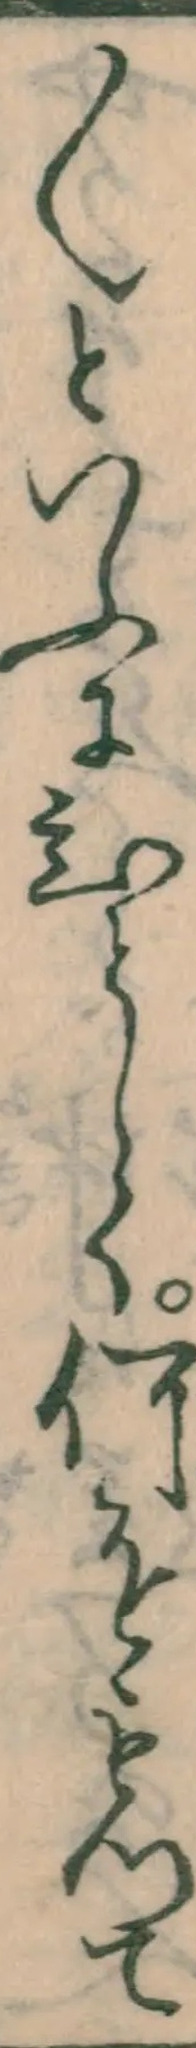〳〵といふにひとしく。何をもつて
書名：麻疹戯言
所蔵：国立国会図書館 National Diet Library, JAPAN
